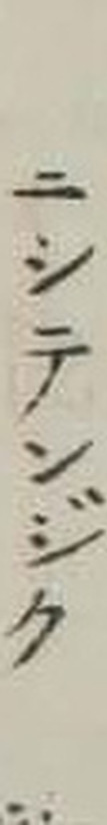ニシテンジク
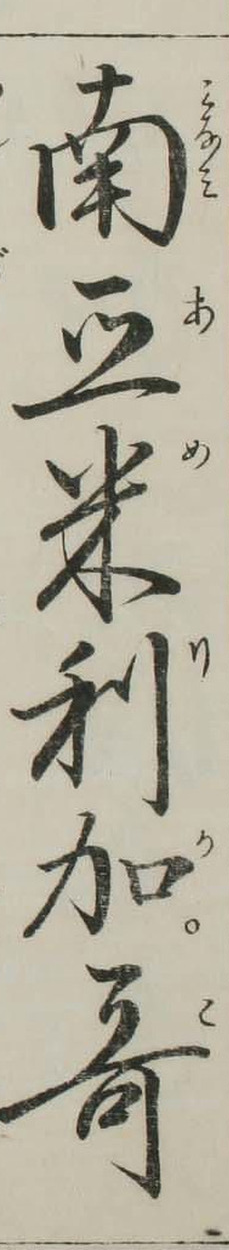南亜米利加。哥
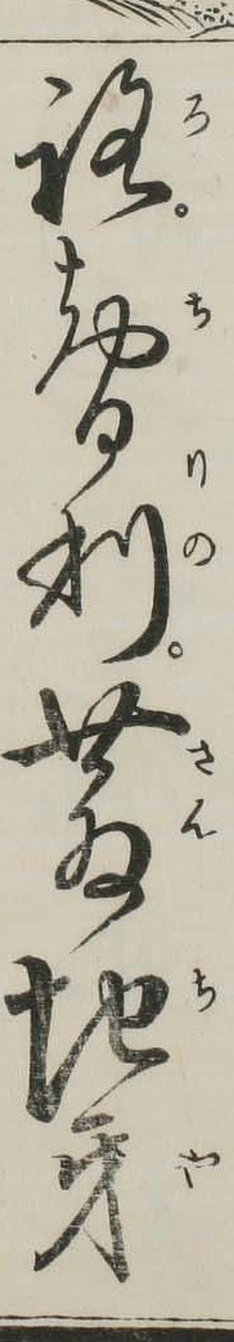路。智利。散地牙
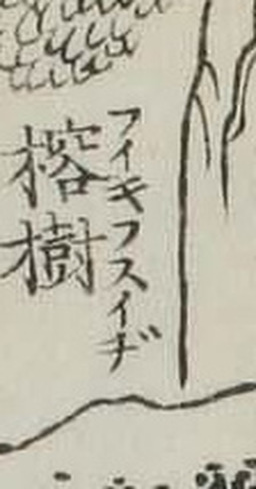フイキフスイヂ
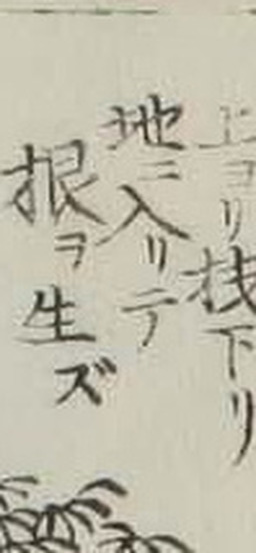根ヲ生ズ
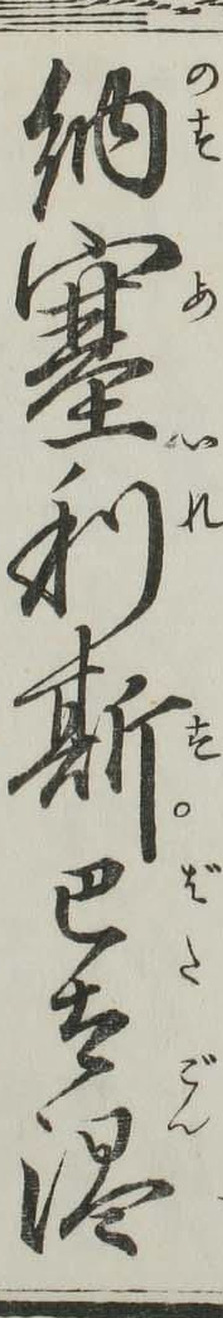納塞利斯。巴太温
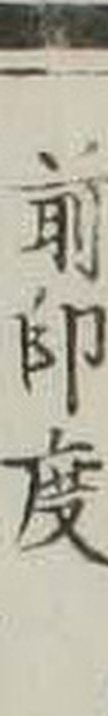前印度
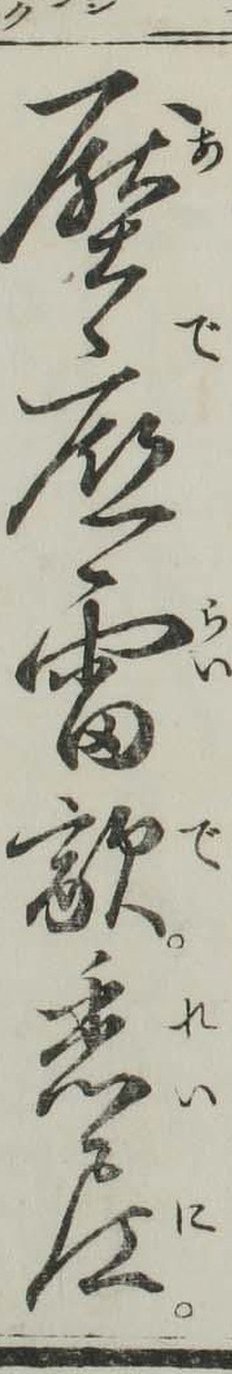壓底雷敵。悉尼。

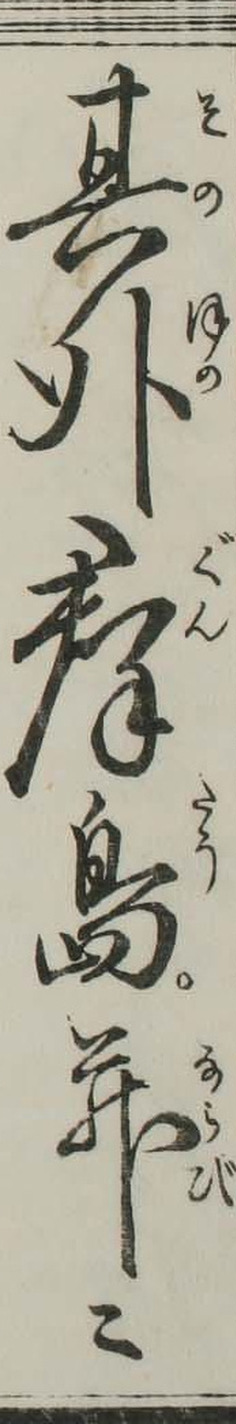其外群島。并に
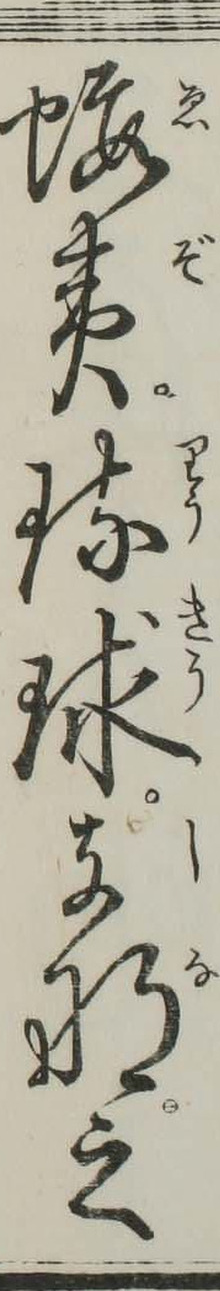蝦夷。琉球。支那。之
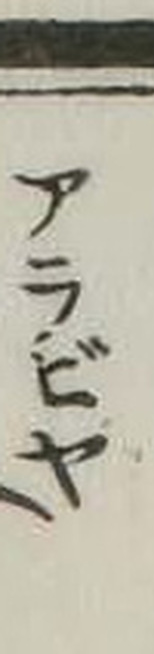アラビヤ
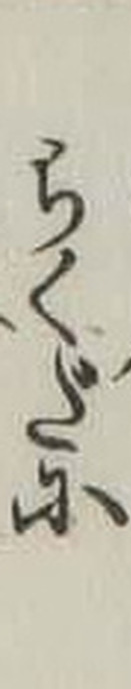らくだに
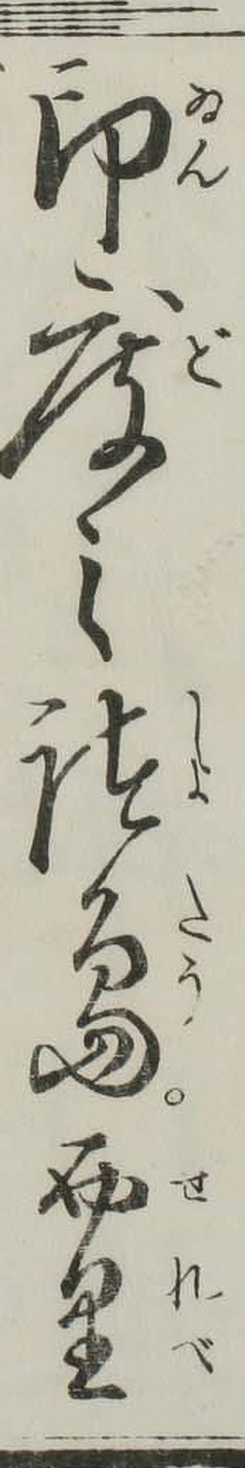印度之諸島。西里
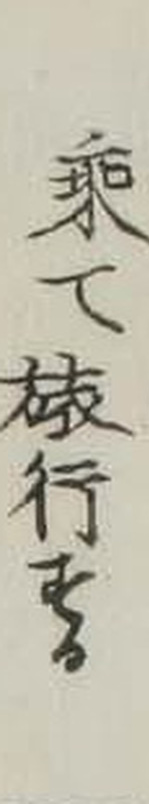乗て旅行する
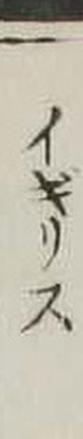イギリス
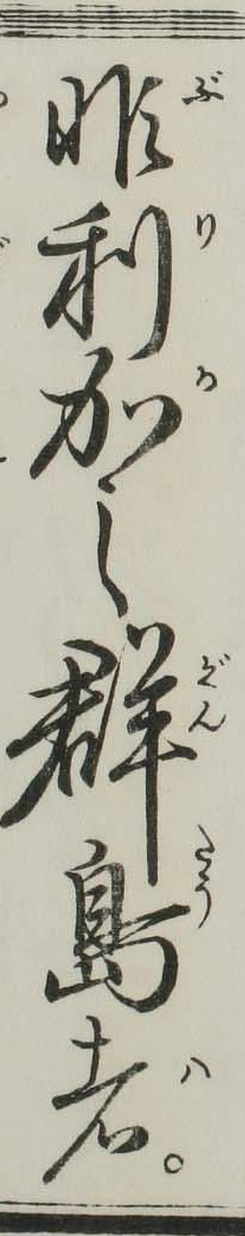非利加之群島者。
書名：開化往来
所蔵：東京学芸大学教育コンテンツアーカイブ
